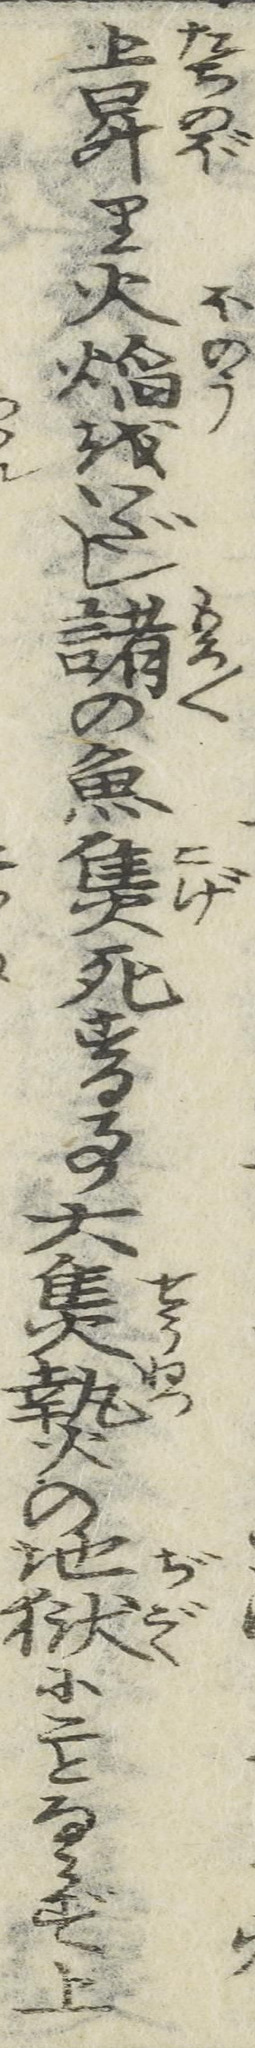上昇り火焔をいだし諸の魚焦死する事大焦熱の地獄にことならず上
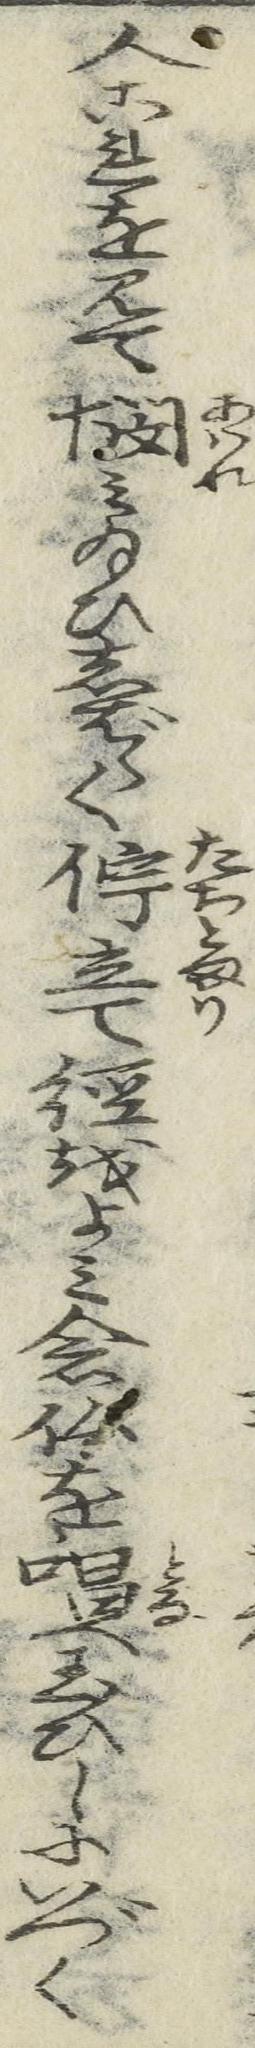人これを見て憫み給ひしばらく停立て経をよみ念仏を唱へ玉ひしにいづく
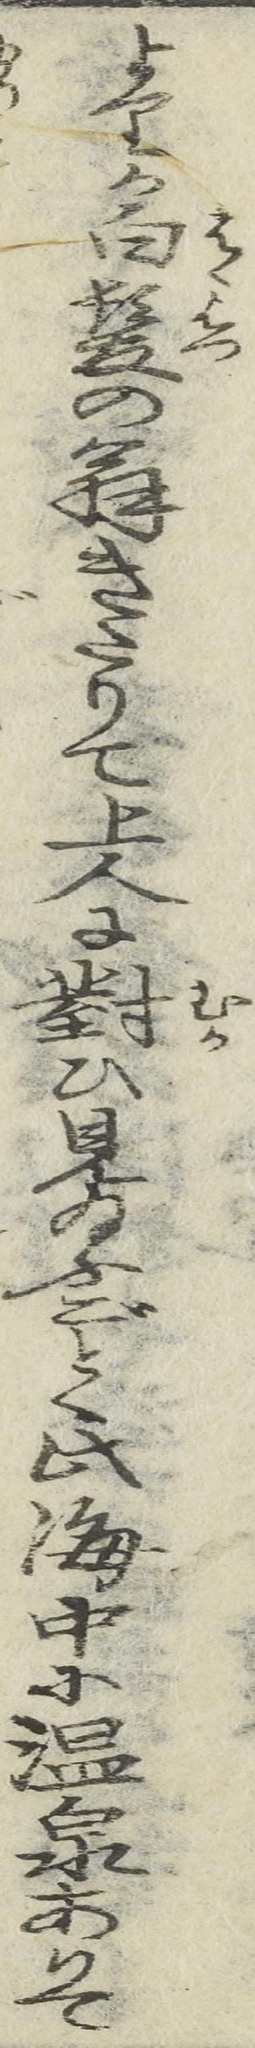よりか白髪の翁きたりて上人に對ひ見給ふごとく此海中に温泉ありて
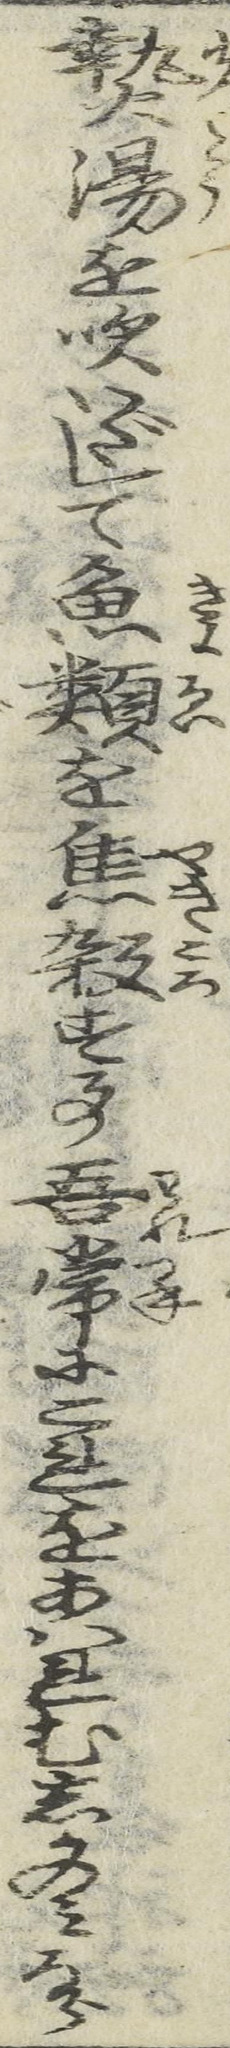熱湯を吹いだして魚類を焦殺す事吾常にこれをあはれむしかのみなら
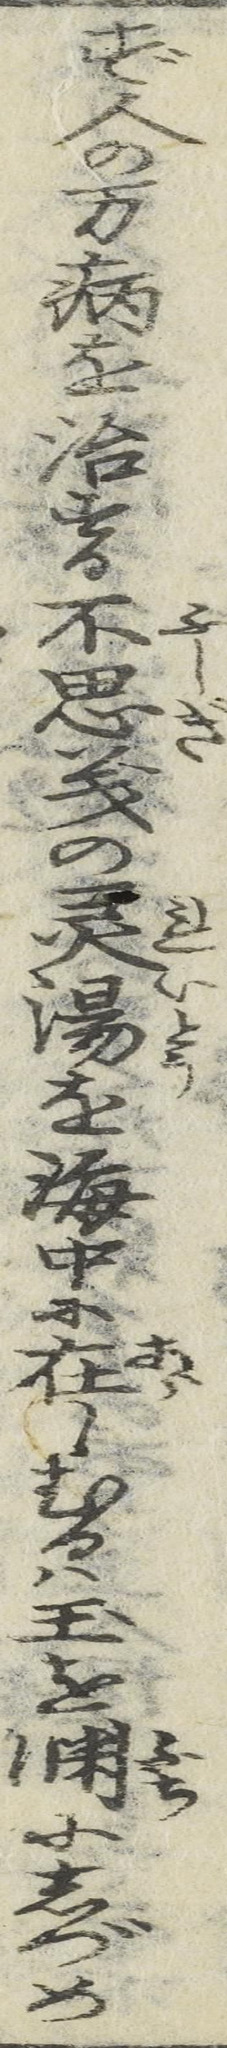ず人の万病を治する不思義の霊湯を海中に在しむるは玉を淵にしづめ
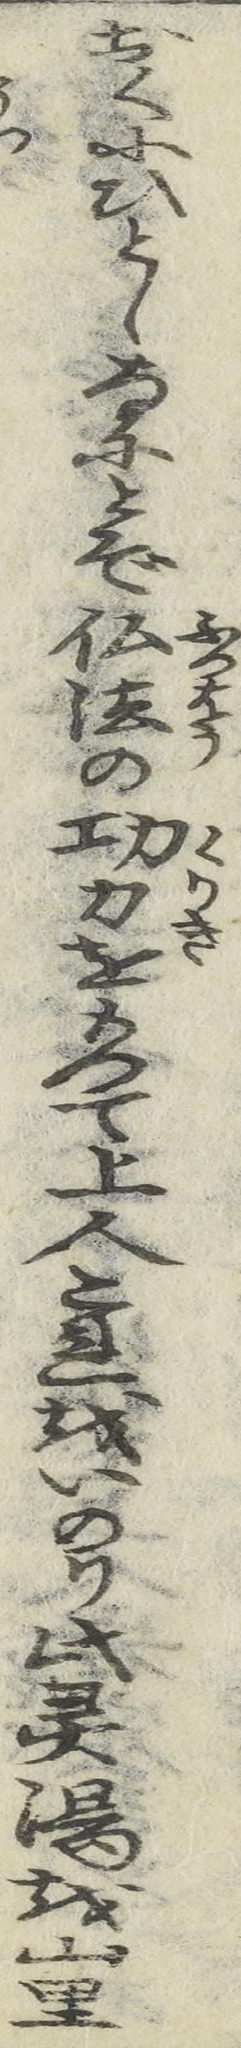おくにひとしなにとぞ仏法の功力をもつて上人これをいのり此霊湯を山里
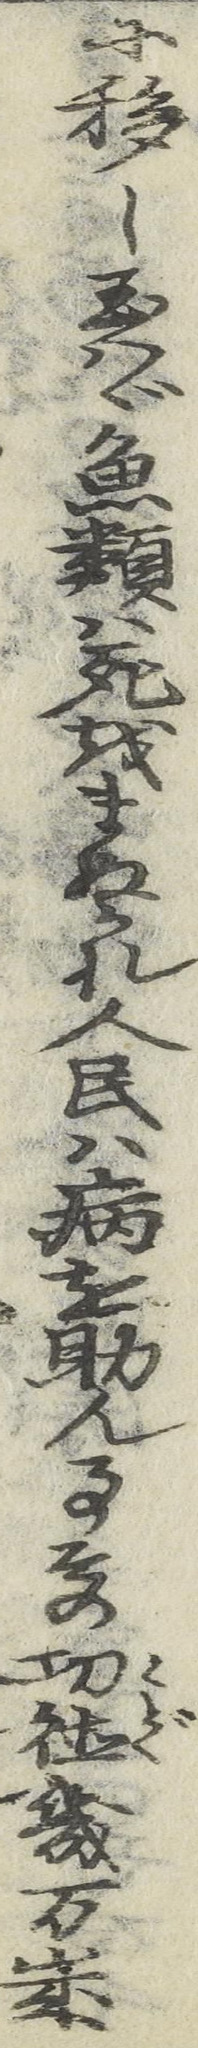に移し玉はゞ魚類は死をまぬかれ人民は病を助ん事その功徳幾万歳
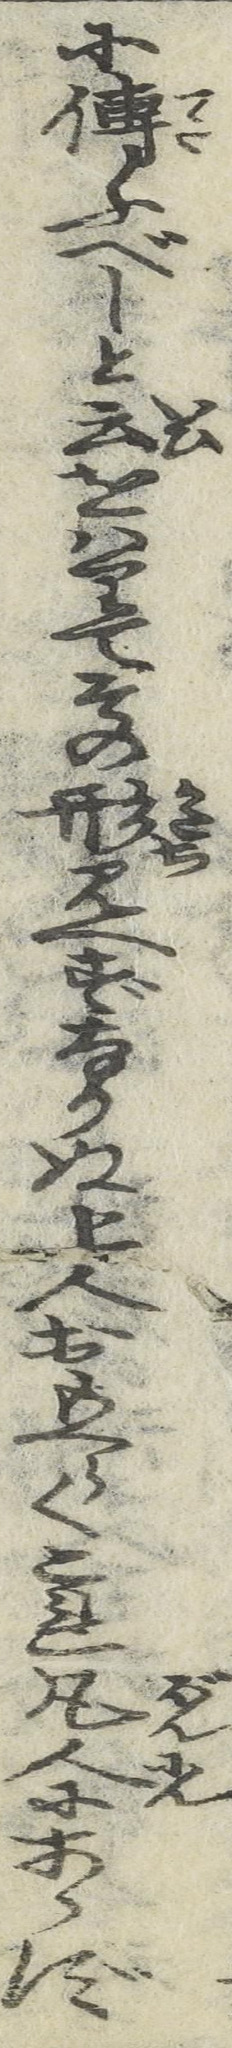に傳ふべしと云おはりてその形見へずなりぬ上人おもへらくこれ凡人にあらず

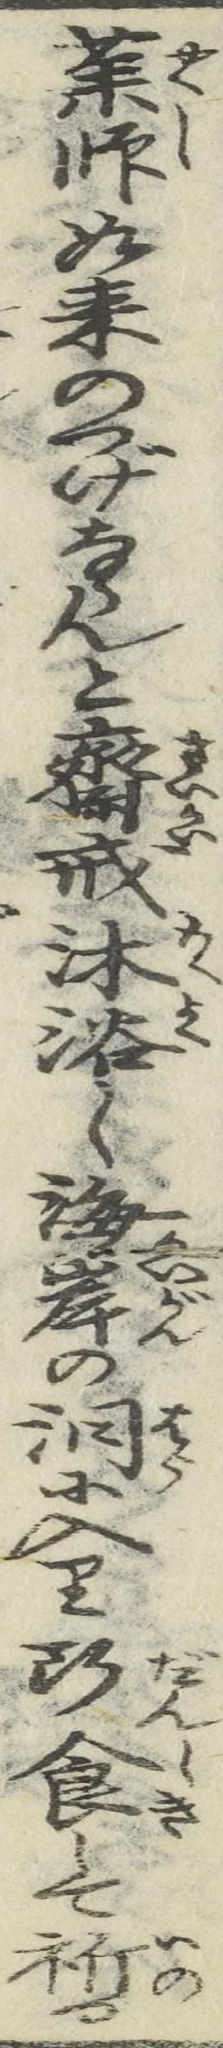薬師如来のつげならんと斎戒沐浴し海岸の洞に入り断食して祈る
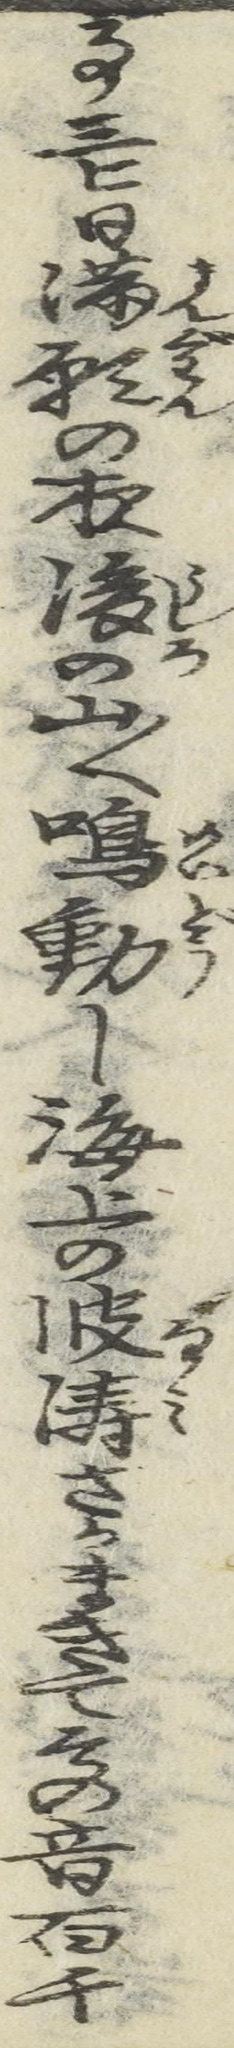事三七日満願の夜後の山〳〵鳴動し海上の波涛さかまきてその音百千
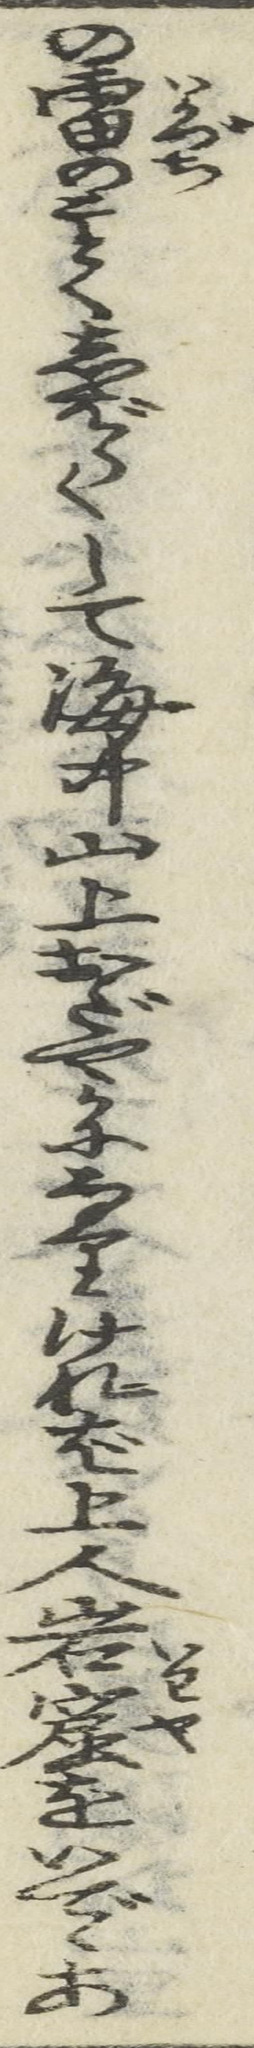の雷のことくしばらくして海中山上おだやかになりければ上人岩窟を出でゝあ
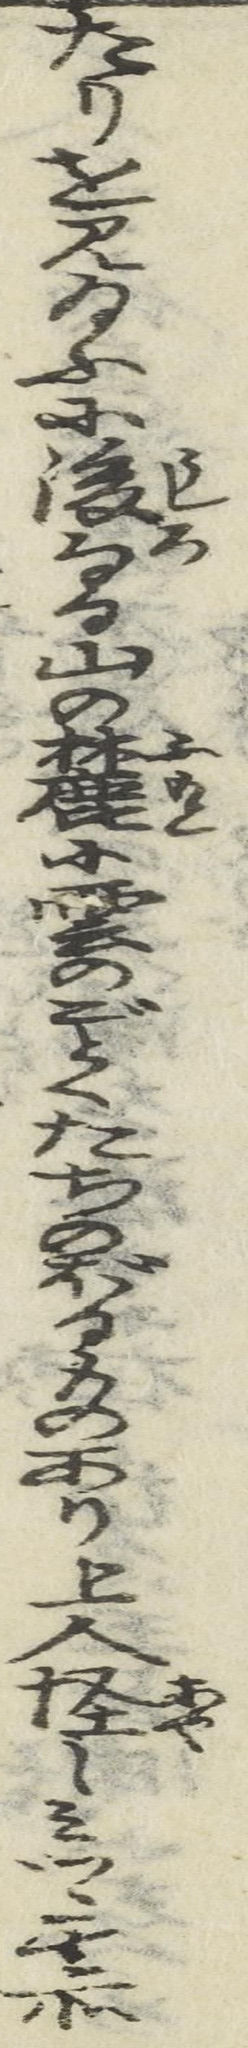たりを見給ふに後なる山の麓に雲のごとくたちのぼるものあり上人怪しみつゝ其所
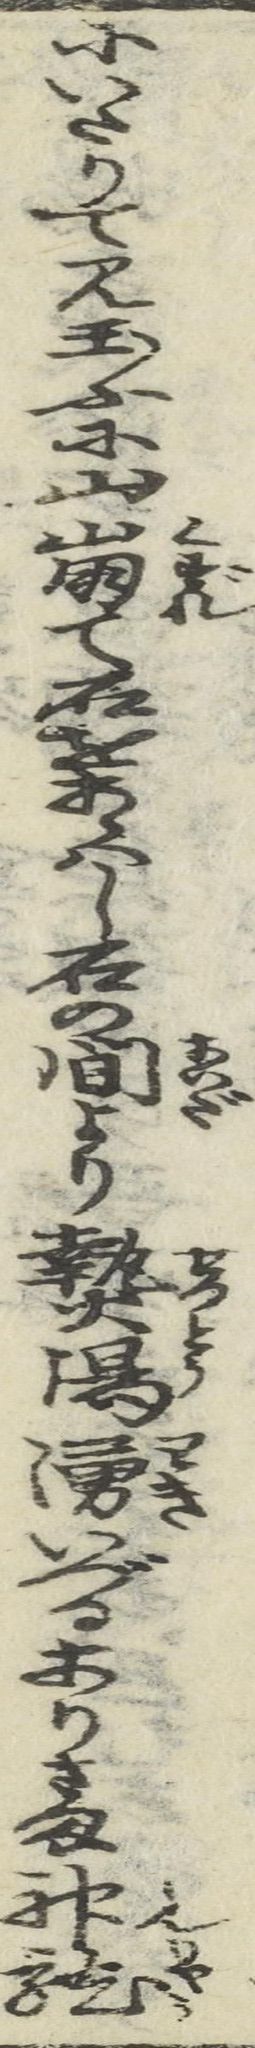にいたりて見玉ふに山崩て石をあらはし石の間より熱湯湧いづるありさま神龍
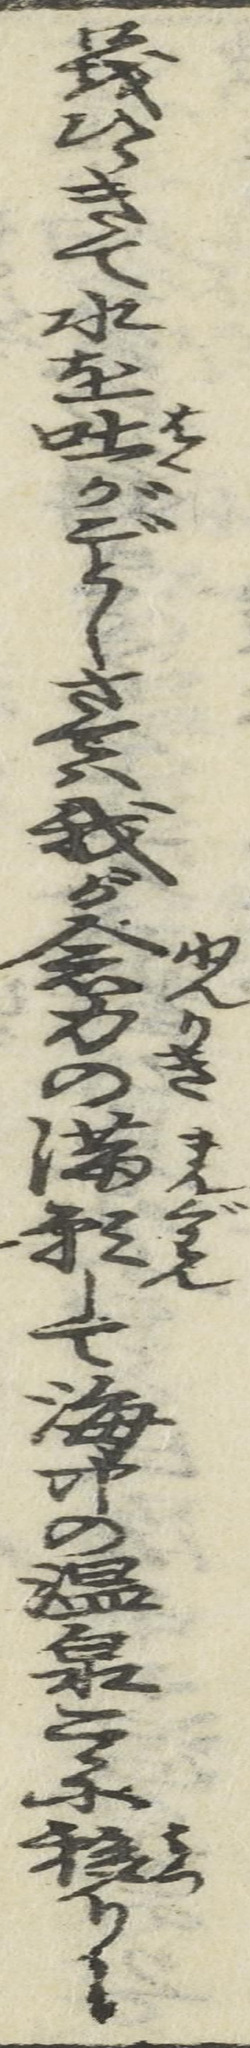口をひらきて水を吐がごとしさては我が念力の満願して海中の温泉こゝに移りし
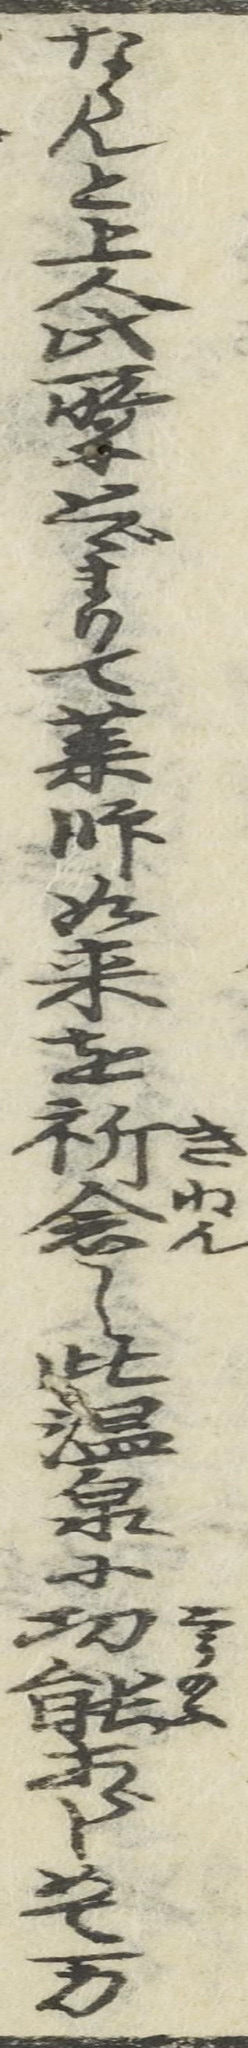ならんと上人此所にとゞまりて薬師如来を祈念し此温泉に功能あらしめて万
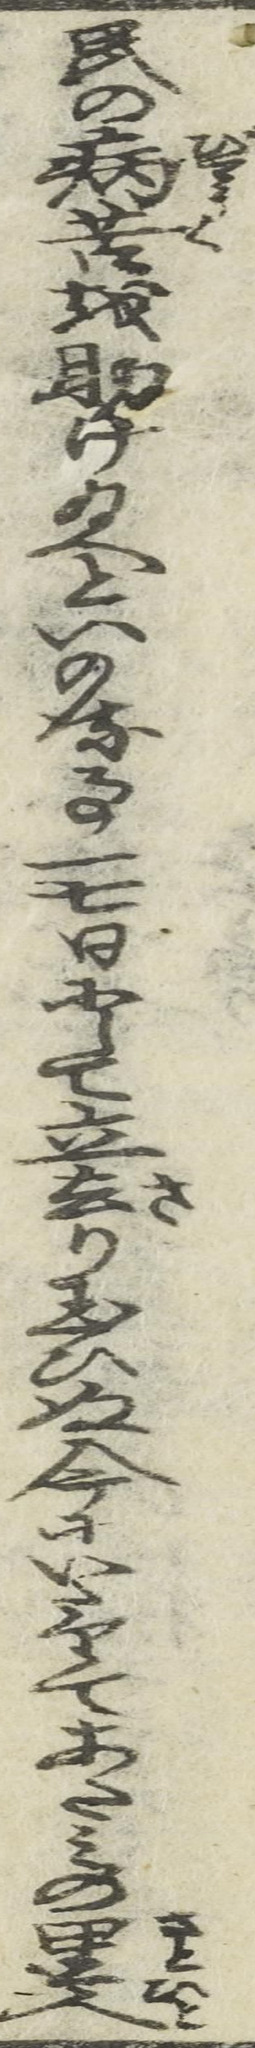民の病苦を助け給へといのる事一七日にして立去り玉ひぬ今にいたりてあたみの里人
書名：熱海温泉圖彙
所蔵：東京大学地震研究所図書室 Earthquake Research Institute Library, The University of Tokyo, JAPAN
